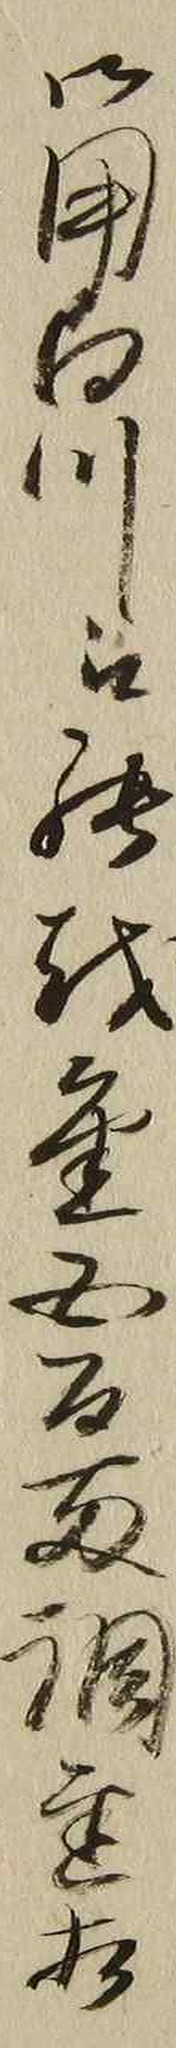御用白川江罷越金五百両調達相
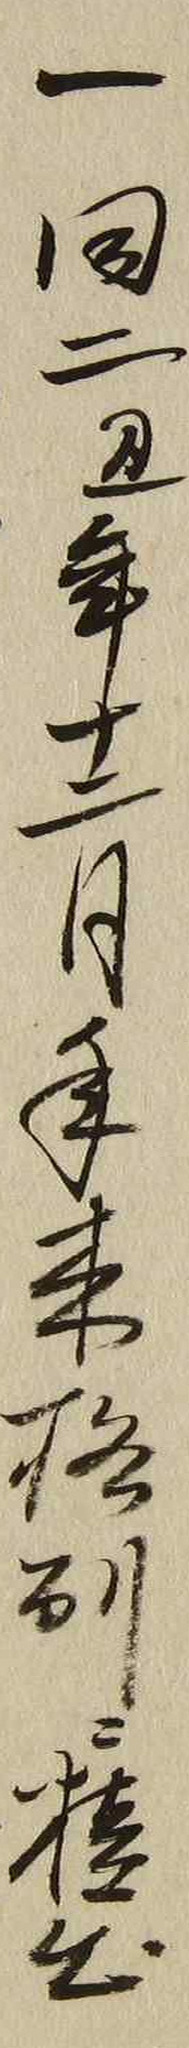一同二丑年十二月年来格別ニ精出
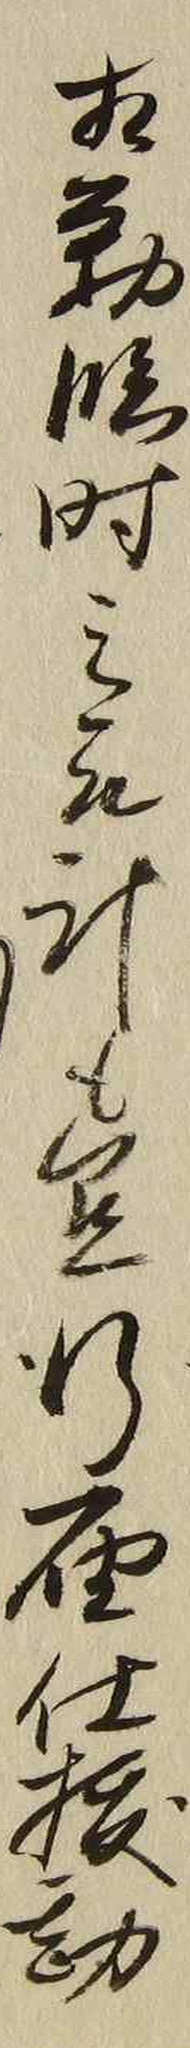相勤臨時之取計も宜行届仕抜勘
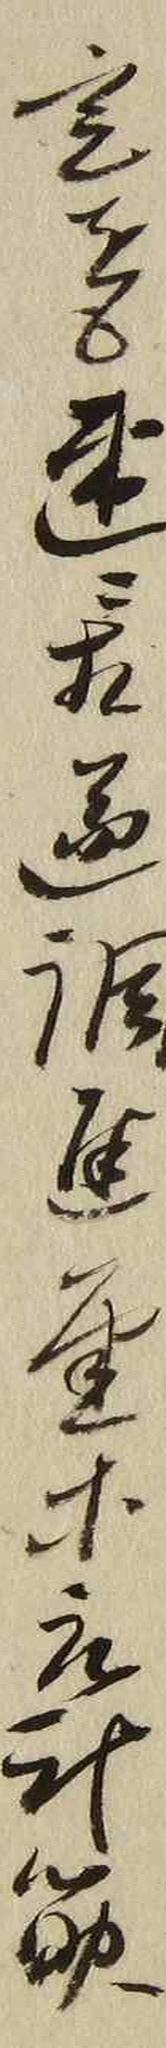定をも速ニ相遂調進金等取計筋へ
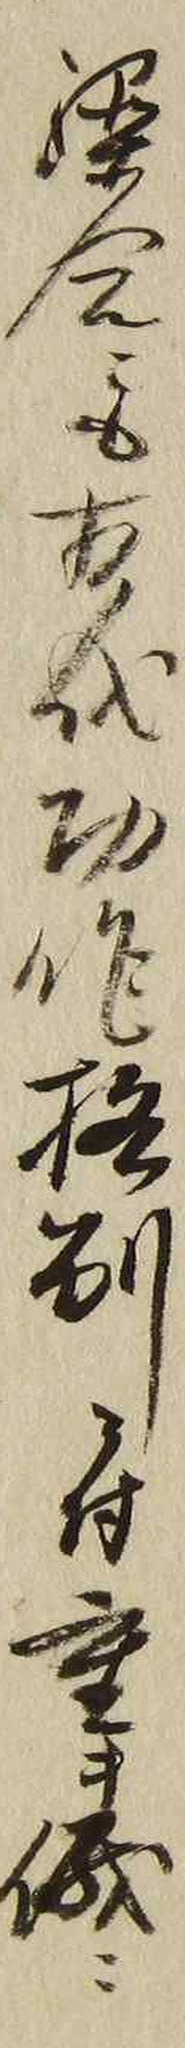繰合ニも相成功作格別ニ付重キ儀ニ
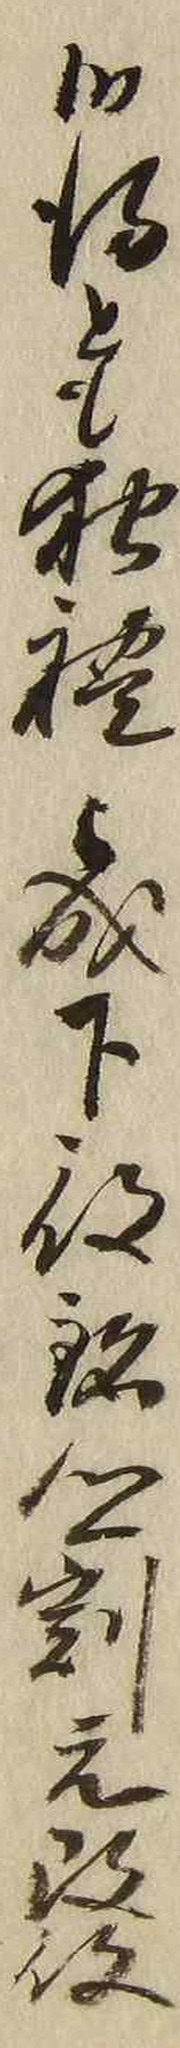候得とも独礼被成下役銘郷割元改役

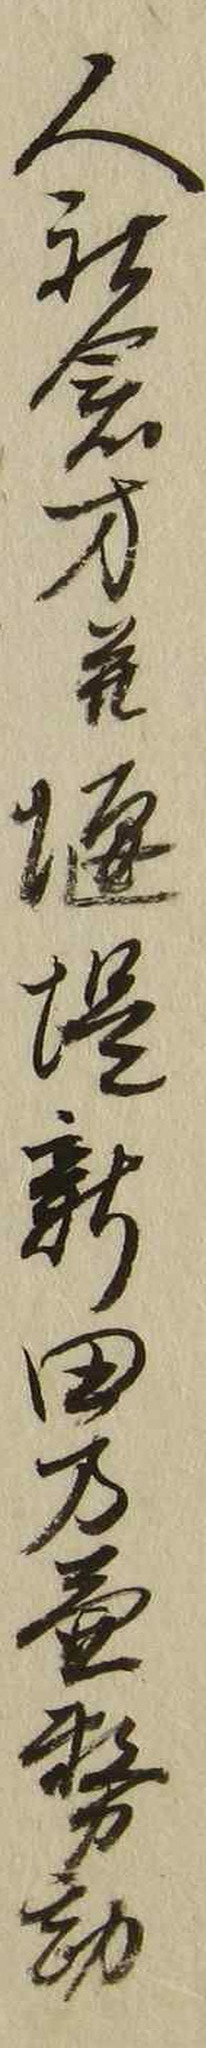人社倉方并堰堤新田方兼務勘
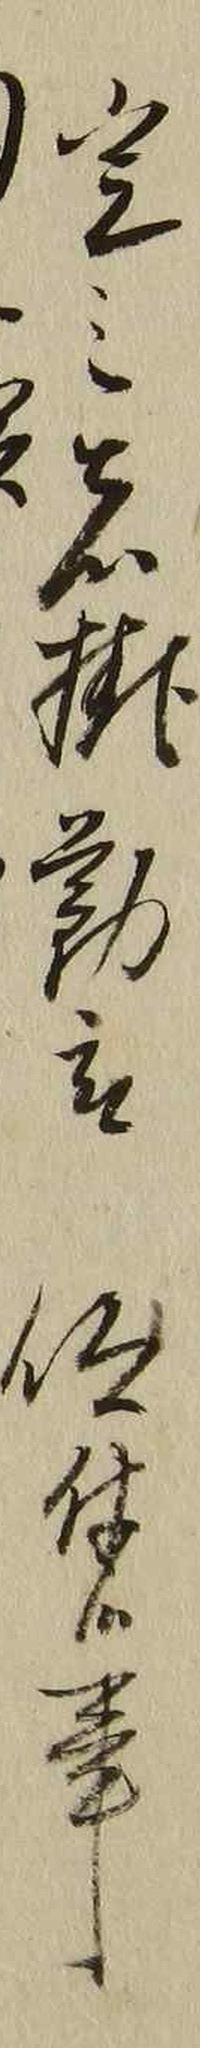定之者掛勤被仰付候事
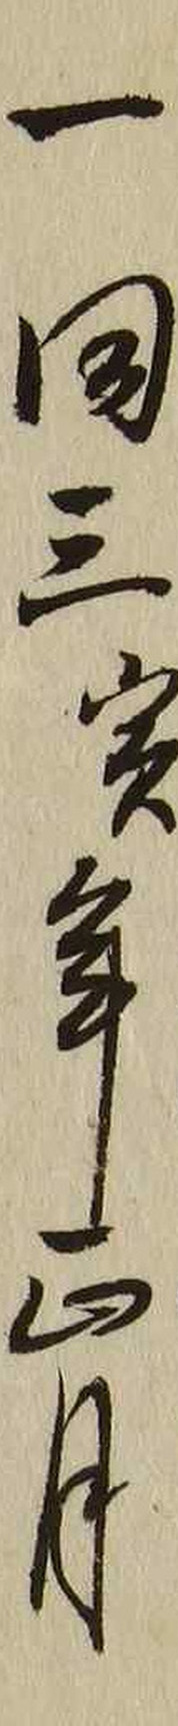一同三寅年正月
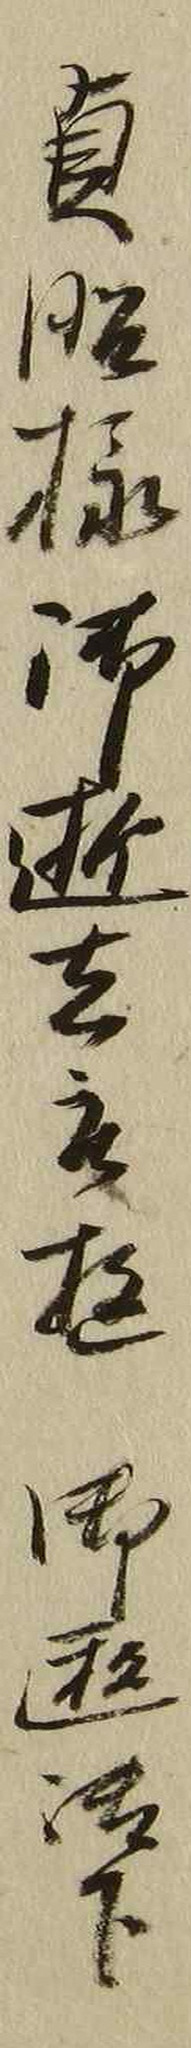貞昭様御逝去被遊御柩御下
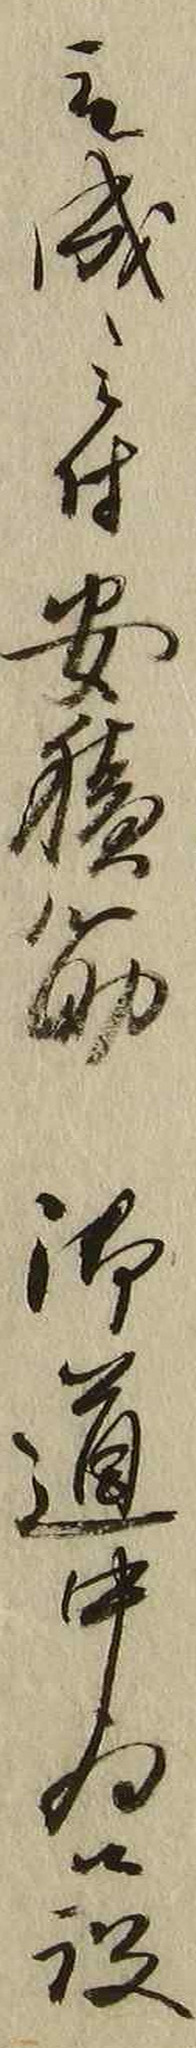被成候ニ付安積筋御道中為御設
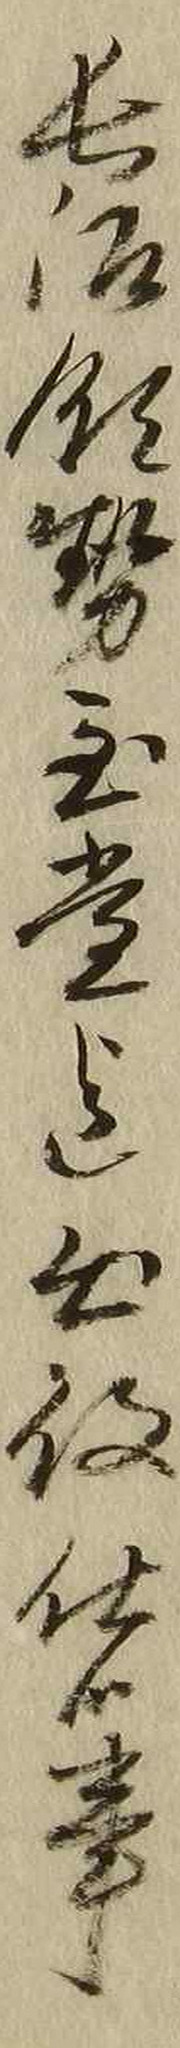長沼領勢至堂迄出役仕候事
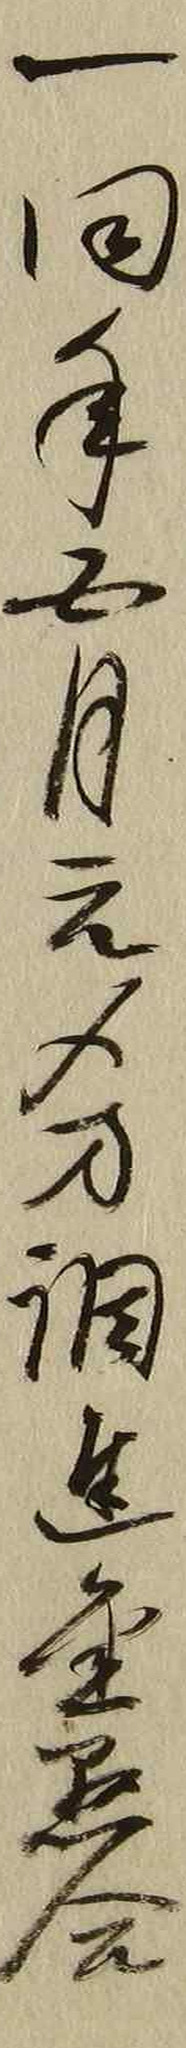一同年五月元〆方調達金懸合
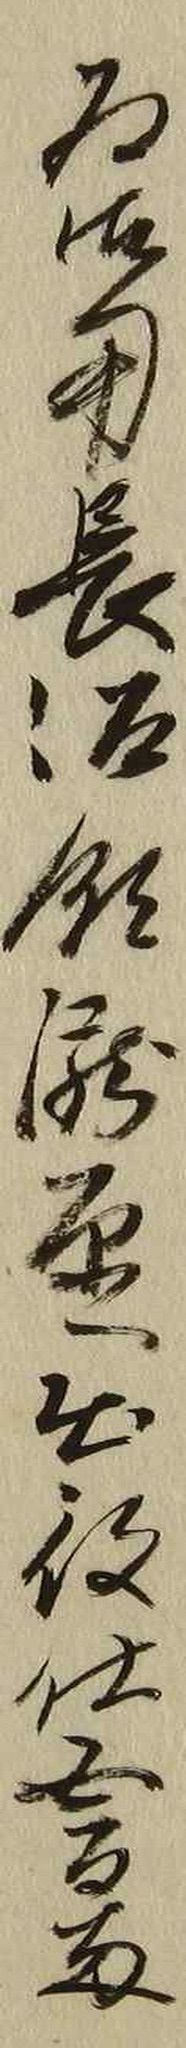為御用長沼領滝原へ出役仕五百両
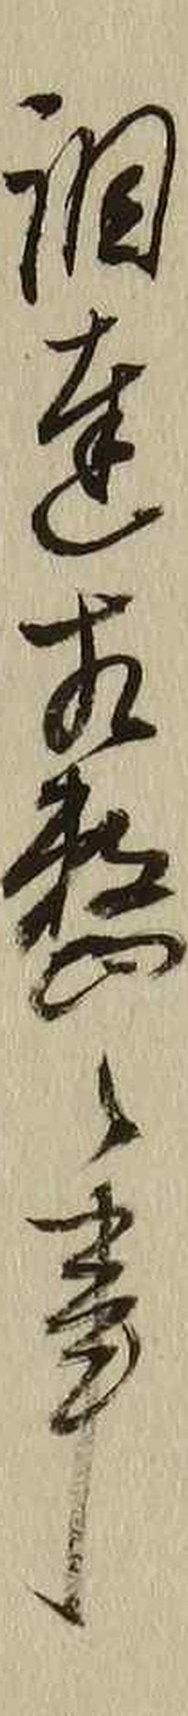調達相整候事
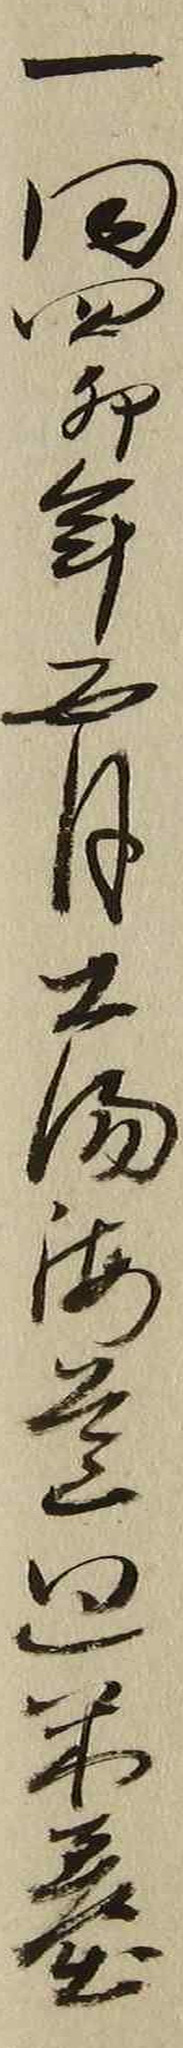一同四卯年五月土湯海道廻米差出
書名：諸士系譜　巻之352　す之部2
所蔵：会津若松市立会津図書館
